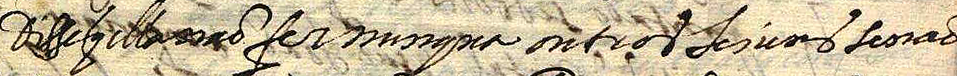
Disse q̄ ella naõ fez nunqua outros Jeiuns senaõ
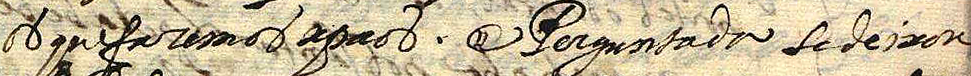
os que fazem os xpaos. ⁋ Perguntada se deixou
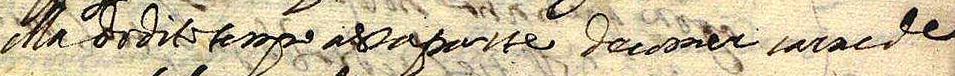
ella do dito tempo a esta parte de comer carne de
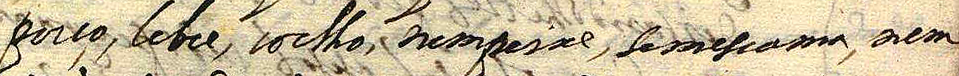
porço, lebre, coelho, nem peixe, sem escama, nem
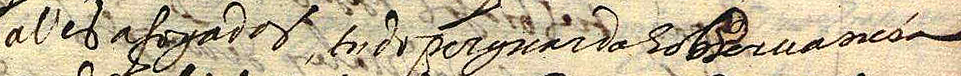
aVes afogadas, tudo per guarda E obseruancia
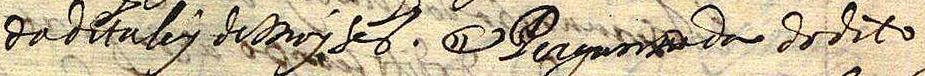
da dita ley de moyses. ⁋ Perguntada do dito
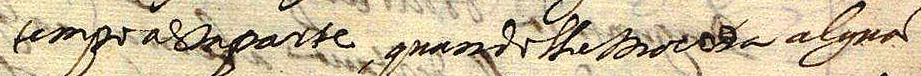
tempo a esta parte, quando lhe mor_ia alguā
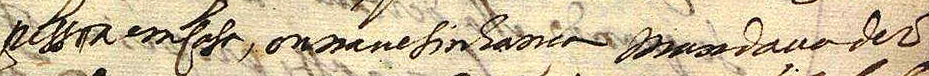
pessoa em Casa, ou na uesinhança mandaua dei
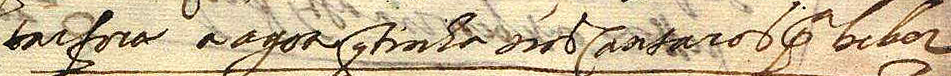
tar fora a agoa q̄ tinha nos Cantaros pa beber
